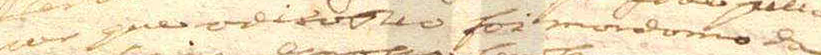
uer que o dito Reo foi mordomo da
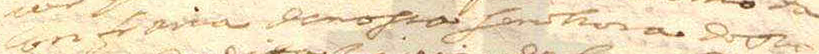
confraria de nossa senhora do Ro
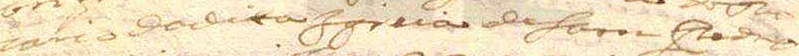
zario da dita Jgreia de sam Pedro
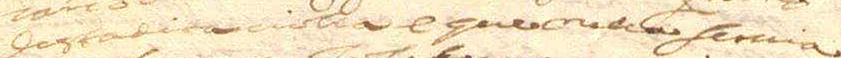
desta dita uilla e que nella seruia
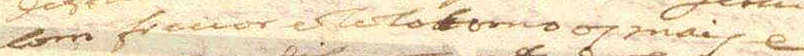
com freuor e zelo Como os mais e
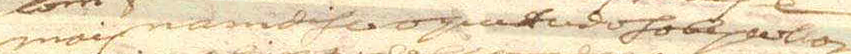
mais nam dise o que tudo sabe pellas
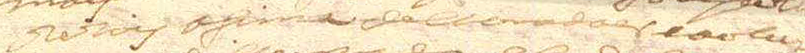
Rezois asima declaradas e ao cus
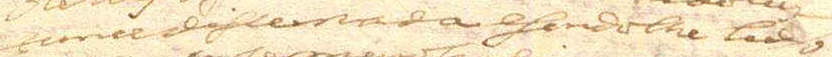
tume disse nada e sendolhe lido
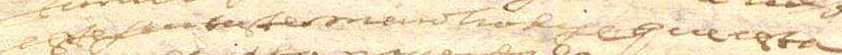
este seu testemunho dise que esta
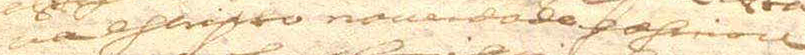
ua escripto na uerdade e asinou
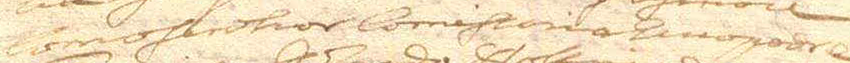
com o senhor Comissario E eu o padre
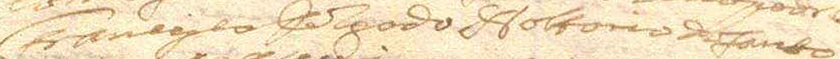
Francisco Delgado Nottario do santo
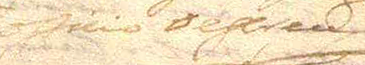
officio o escreui
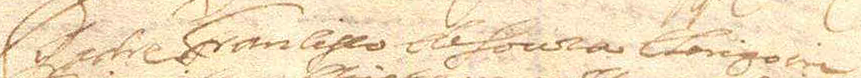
O Padre Francisco de souza Clerigo in
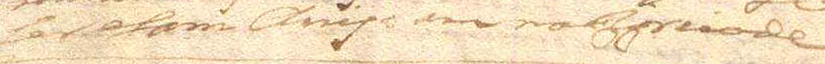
ser o samChristam na Jgreia de
